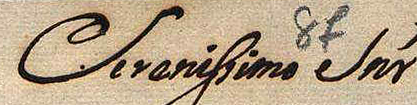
Serenissimo Snr̄
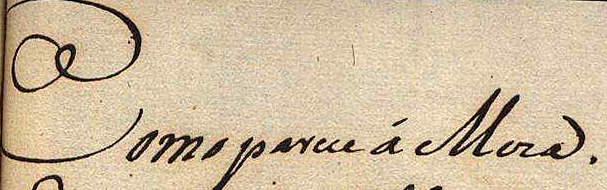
Como parece á Meza.
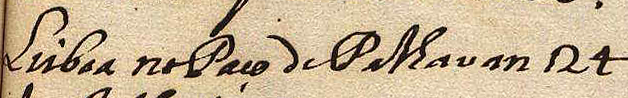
Lisboa no Paço de Palhavan 24
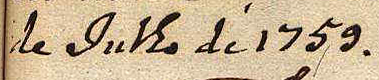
de Iulho de 1759.
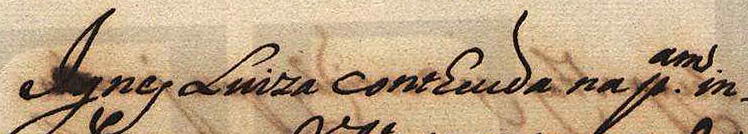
Ignes Luiza contheuda na p.am in
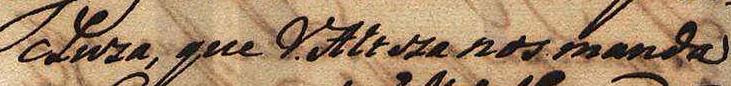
cluza, que V. Alteza nos manda
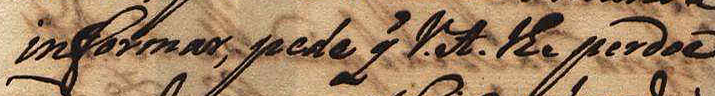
informar, pede q̄ V.A. lhe perdoe
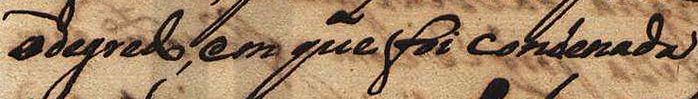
o degredo, em que foi condenada
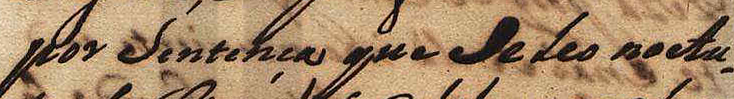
por Sentença que se Leo no Au
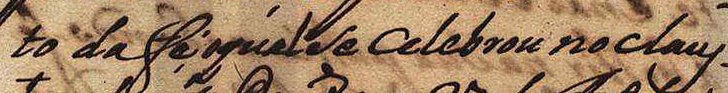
to da fé, o qual se celebrou no claus
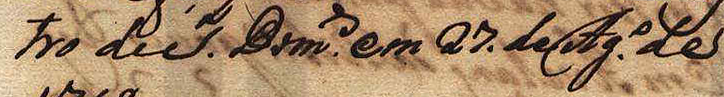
tro de S. Dom.os em 27. de Ag.o de
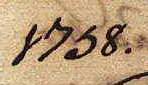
1758.
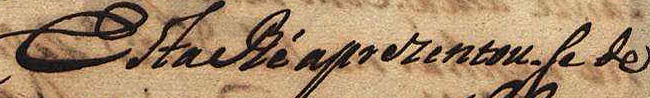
Esta Ré aprezentou-se de
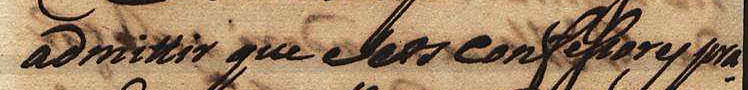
admittir que seos confessores pra
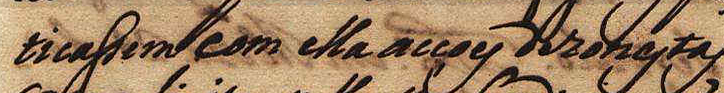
ticassem com ella acçoes dezonestas
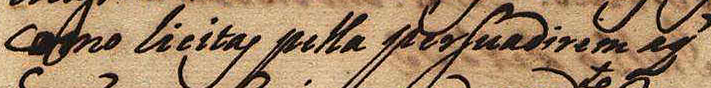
como licitas pella persuadirem a q̄
